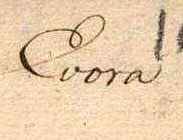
Evora
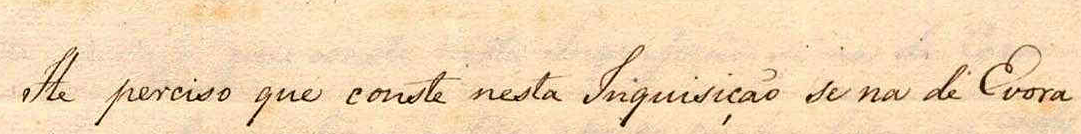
He perciso que conste nesta Inquisiçaõ se na de Evora
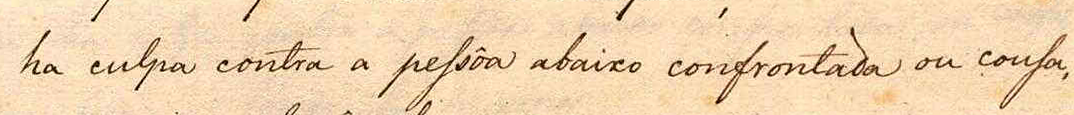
ha culpa contra a pessoa abaixo confrontada ou cousa,
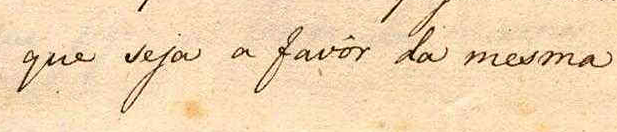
que seja a favôr da mesma
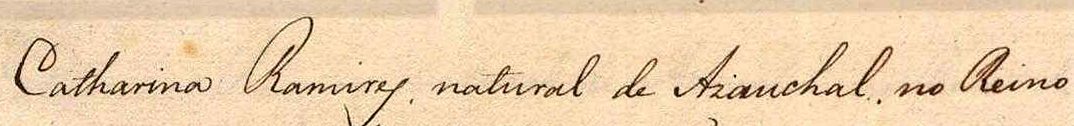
Catharina Ramires, natural de Azauchal, no Reino
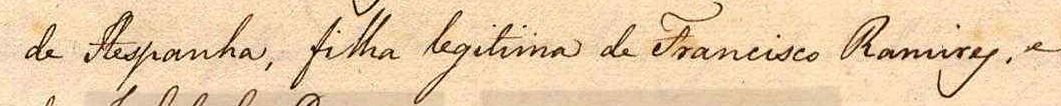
de Hespanha, filha legitima de Francisco Ramires, e
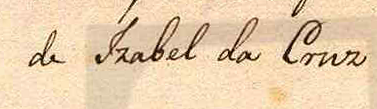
de Izabel da Cruz
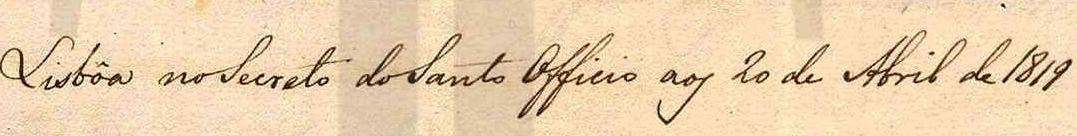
Lisboa no Secreto do Santo Officio aos 20 de Abril de 1819
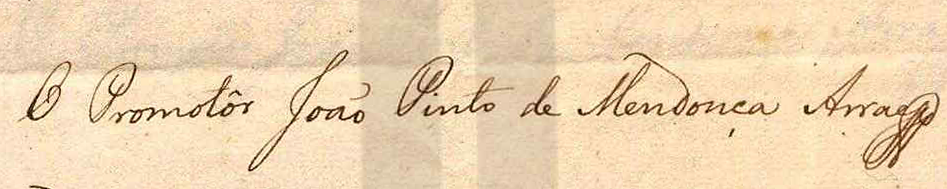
O Promotor Joaõ Pinto de Mendonça Arraes
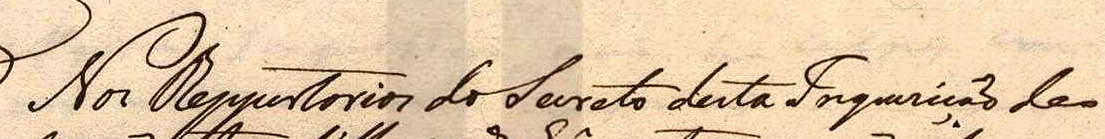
Nos Reppertorios do Secreto desta Inquisiçaõ de
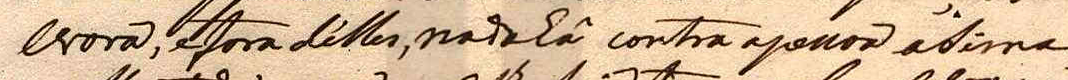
Evora, e fora delles, nada há contra a pessoa aSima
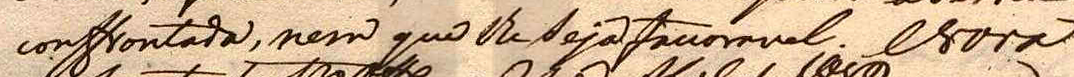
conffrontada, nem que lhe Seja fauoravel. evora
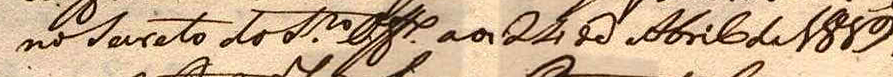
no Secreto do S.to Off.o aos 24 de Abril de 1819
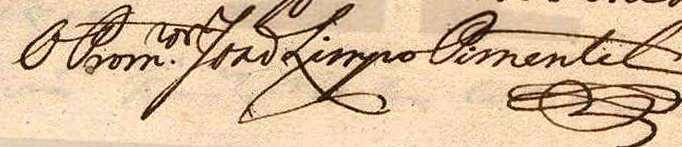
O Prom.tor Joaõ Limpo Pimentel
